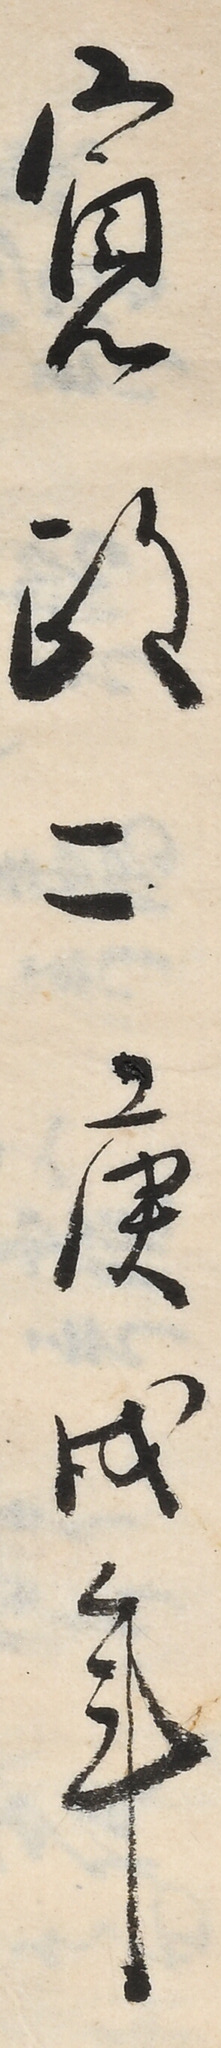寛政二庚戌年
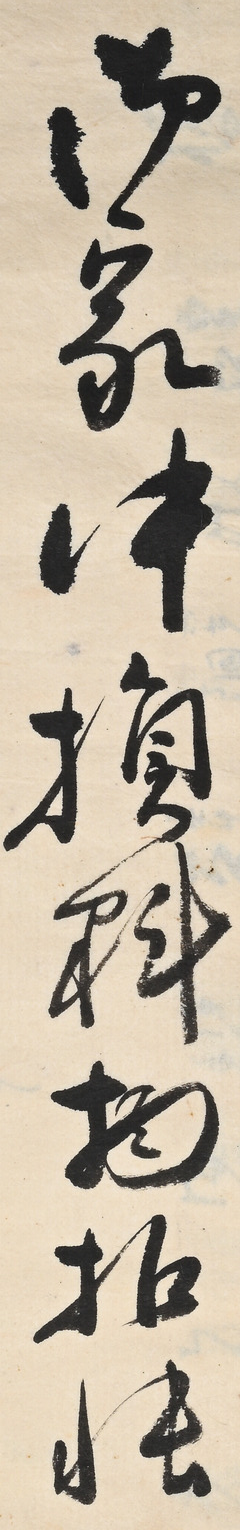御家中損料物控帳
